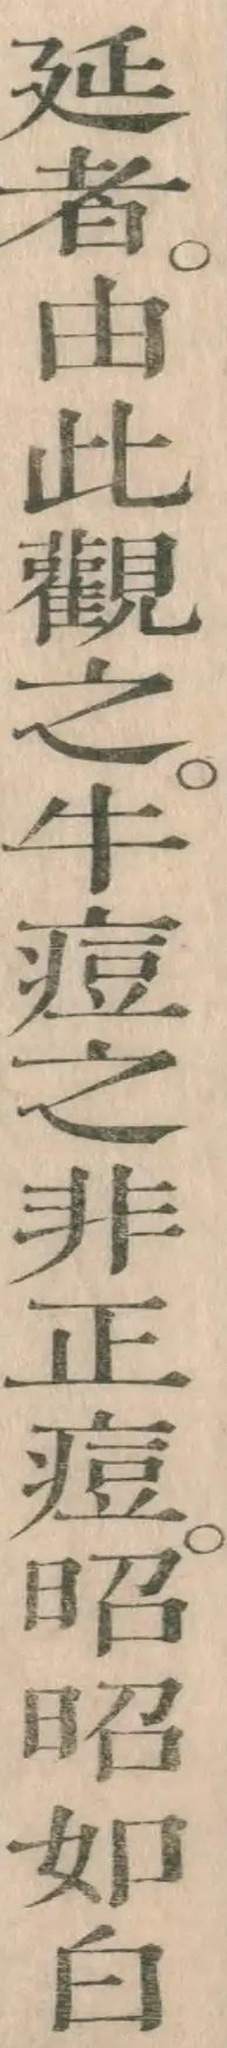延者。由此観之。牛痘之非正痘。昭昭如白
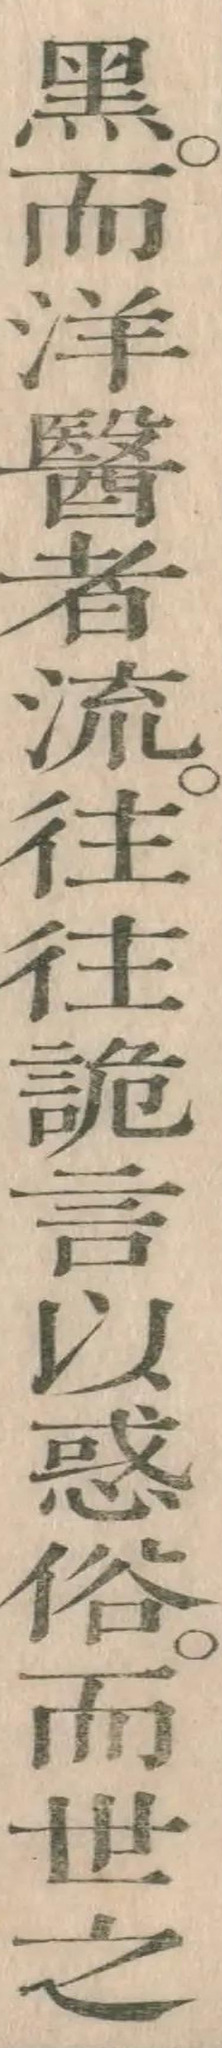黒。而洋医者流。往往詭言以惑俗。而世之
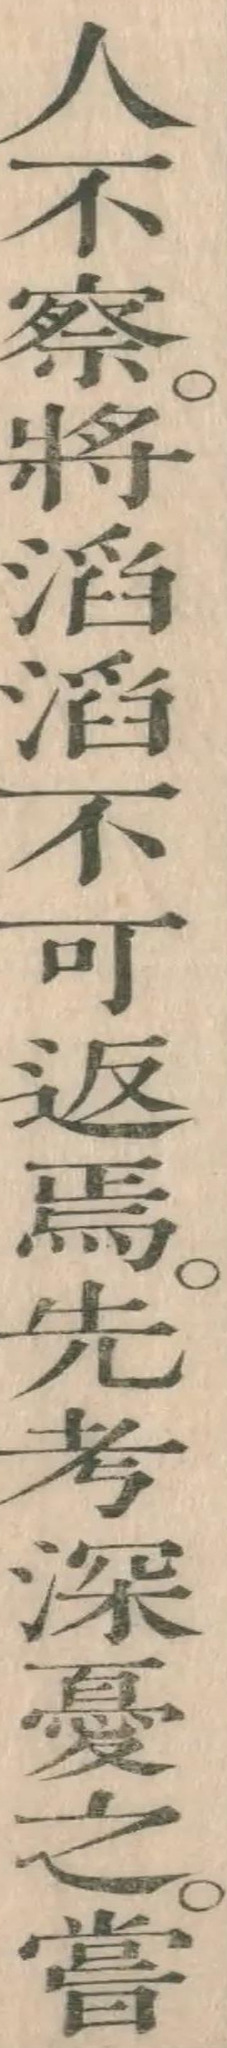人不察。将滔滔不可返焉。先考深憂之。嘗
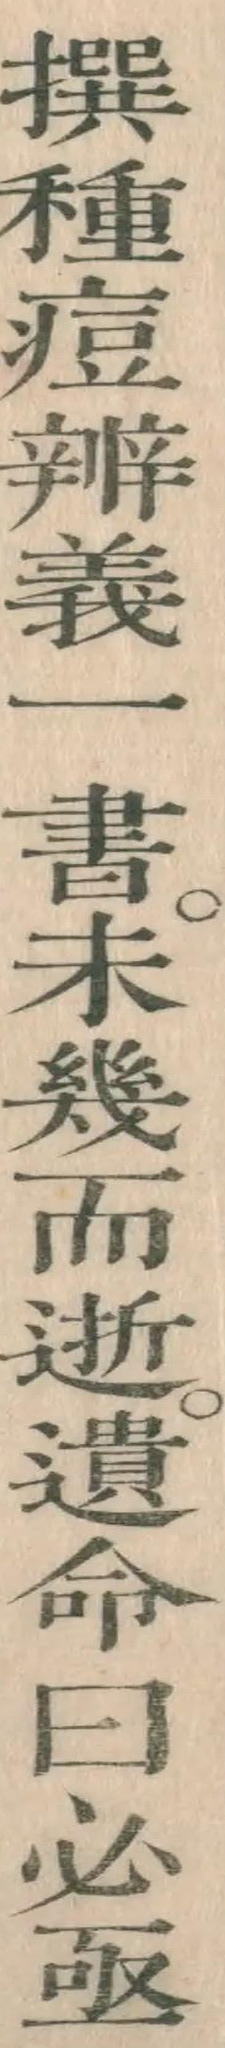撰種痘弁義一書。未幾而逝。遺命曰必亟
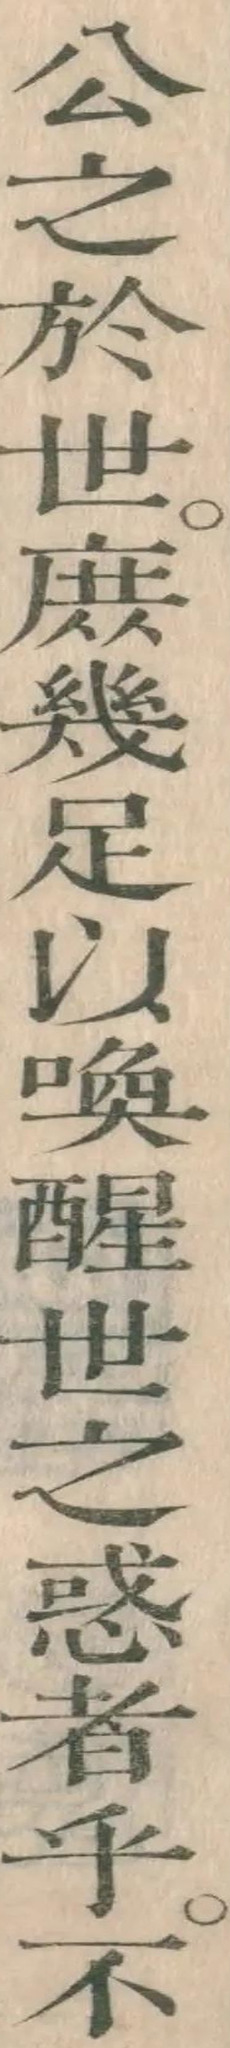公之於世。庶幾足以喚醒世之惑者乎。不
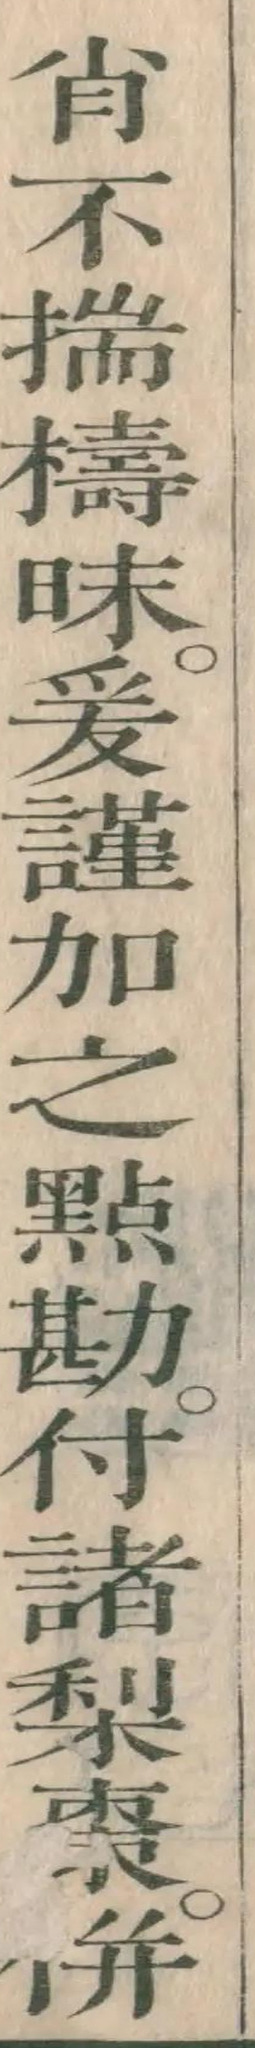肖不揣檮味。爰謹加之点勘。付諸梨棗。併
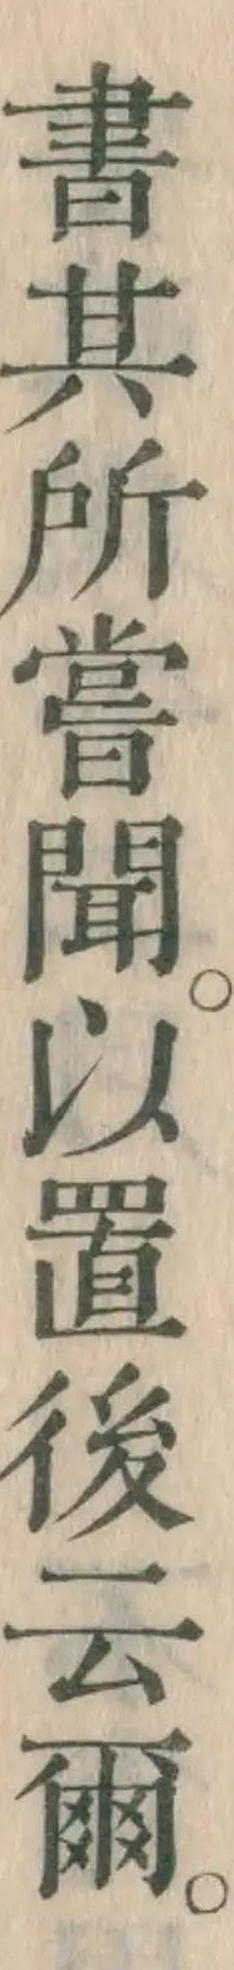書其所嘗聞。以置後云爾。

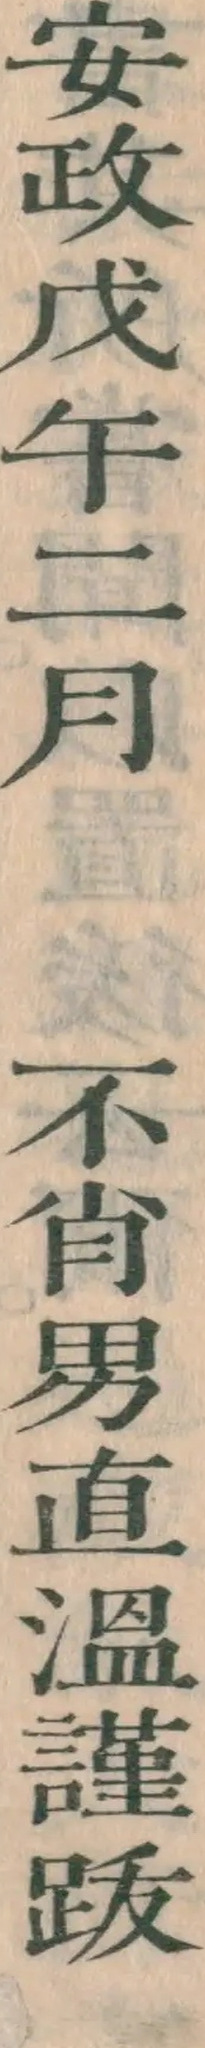安政戌午二月不肖男直温謹跋
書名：種痘弁義
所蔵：国立国会図書館 National Diet Library, JAPAN
